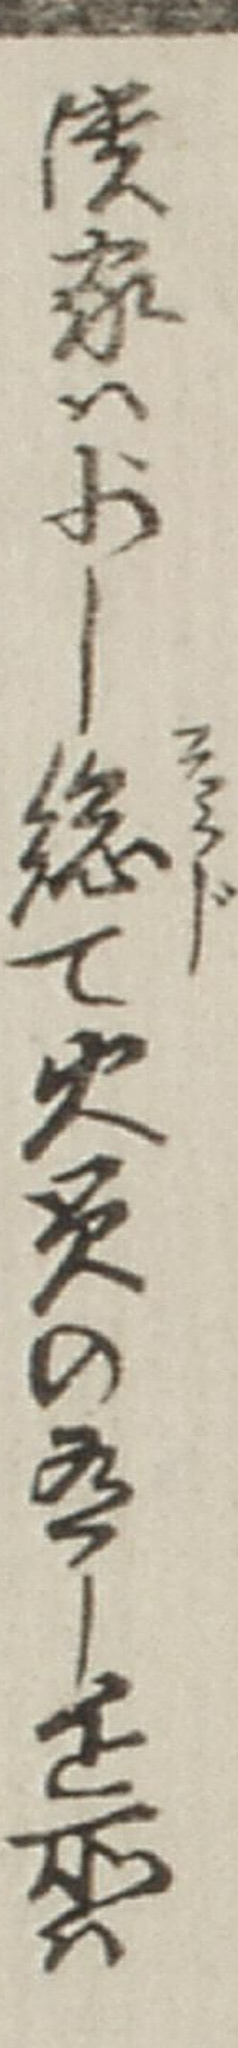潰家は少し総て火災の有し近所は
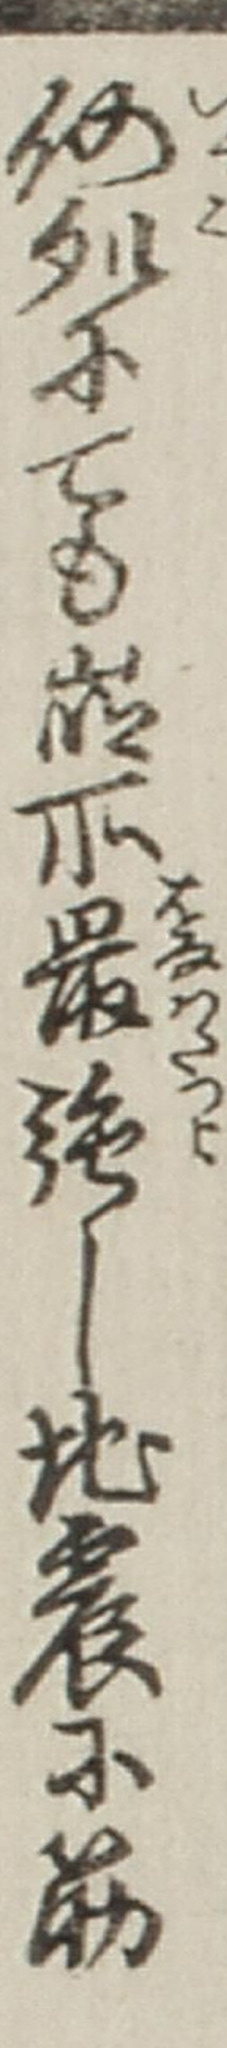何処にても崩所最強し地震に筋
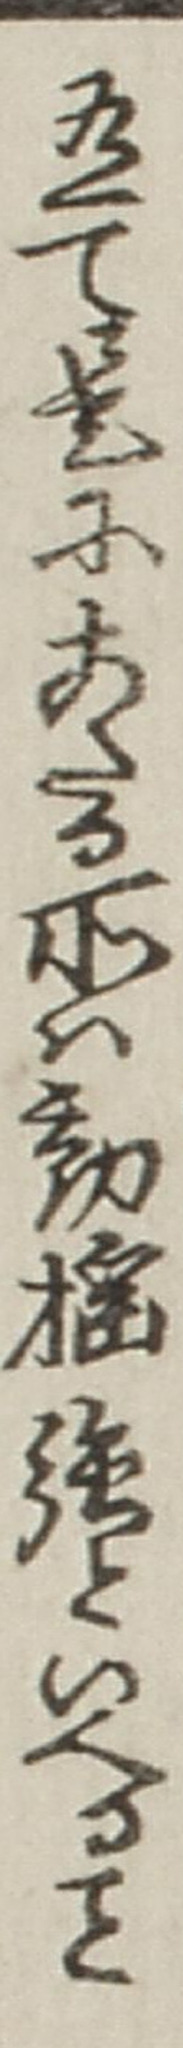有て是にあたる所は動揺強といへること
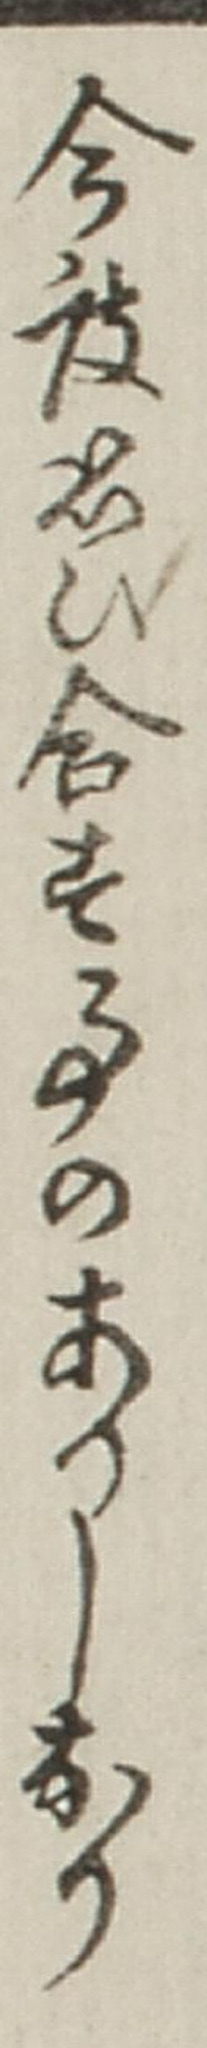今度思ひ合す事のありしなり
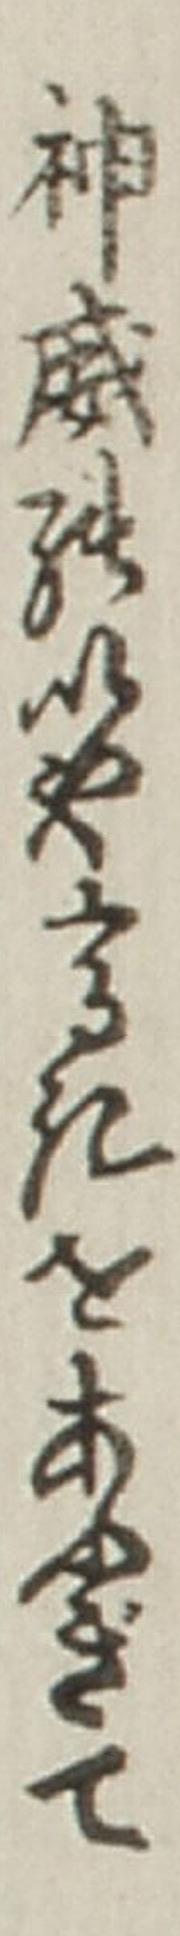神威のいや髙きをあふぎて
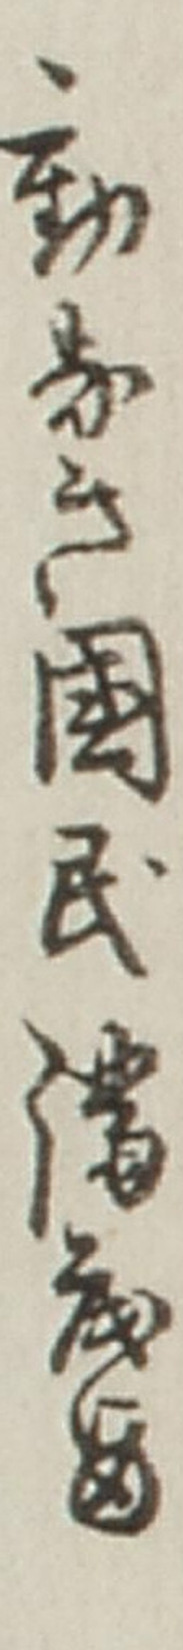動なき国民まもる
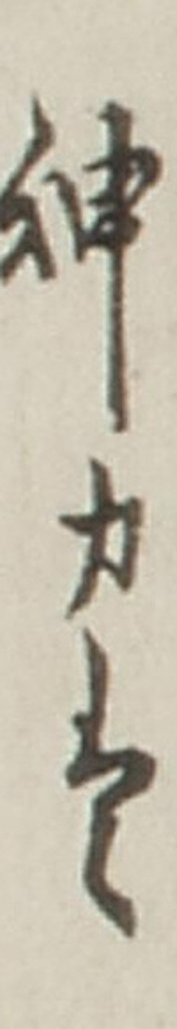神力は
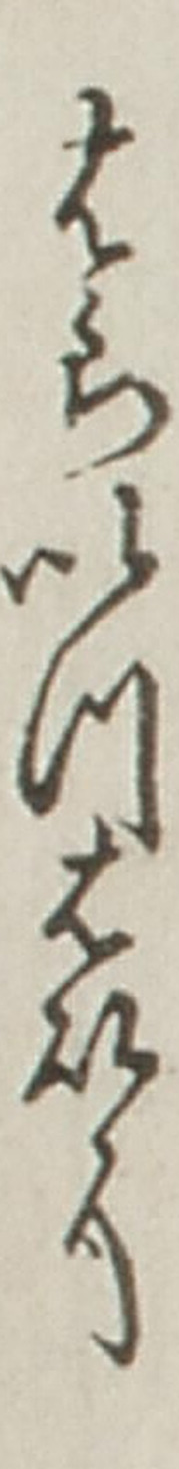はらいつはいに
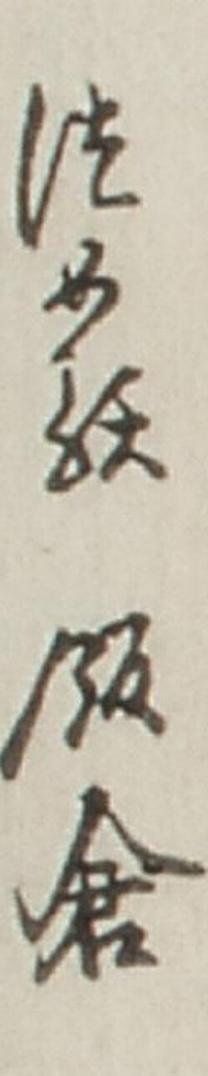つめる飯倉

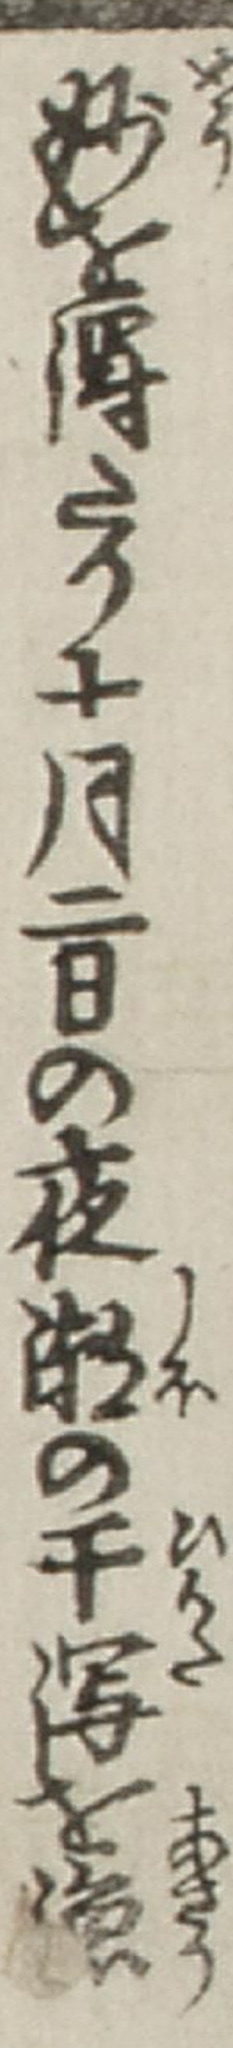妙を得たり十月二日の夜潮の干潟を漁
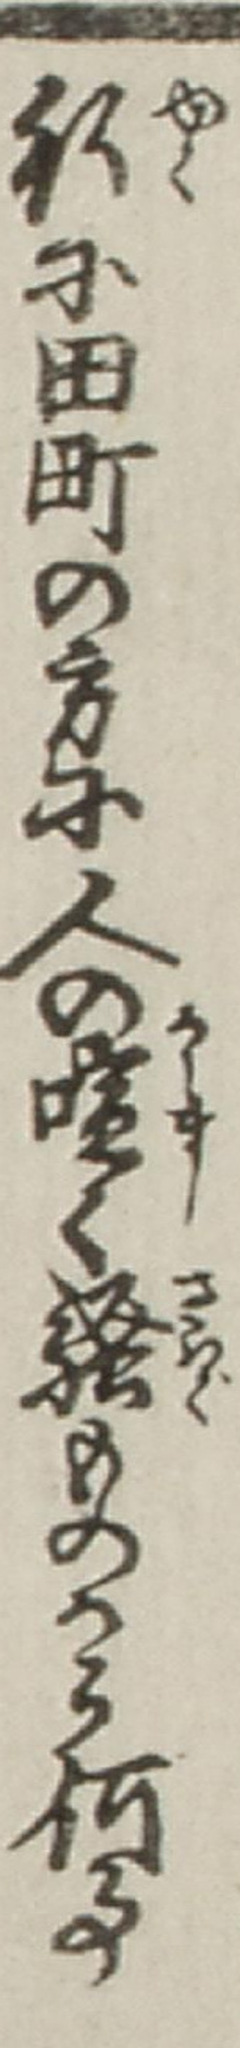行に田町の方に人の喧く騒ものから何事
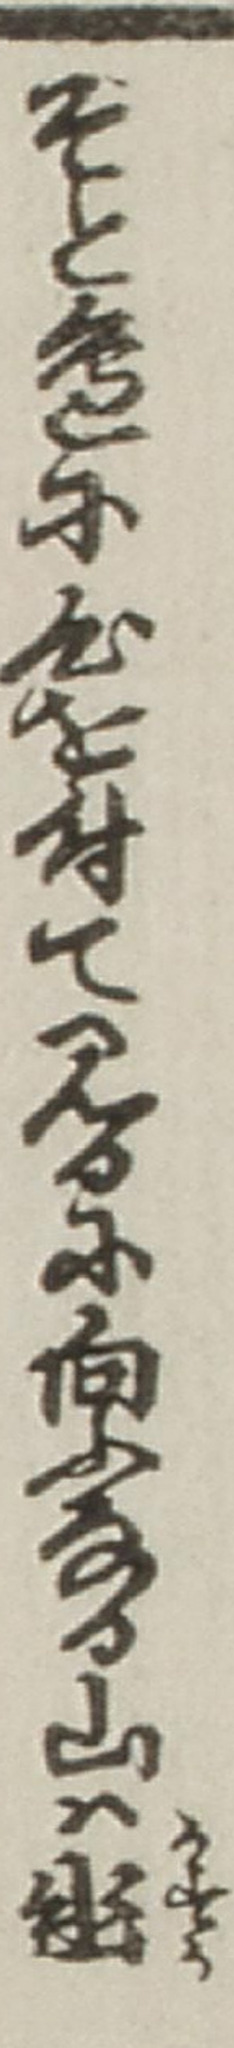ぞと辺に心を付て見るに向ふなる山は幽
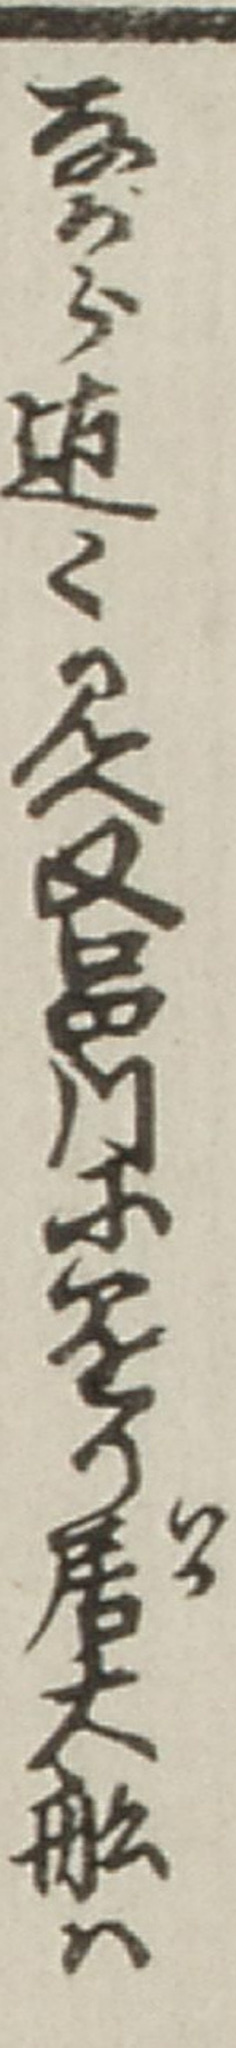なから近く見へ又品川に懸り居大船は
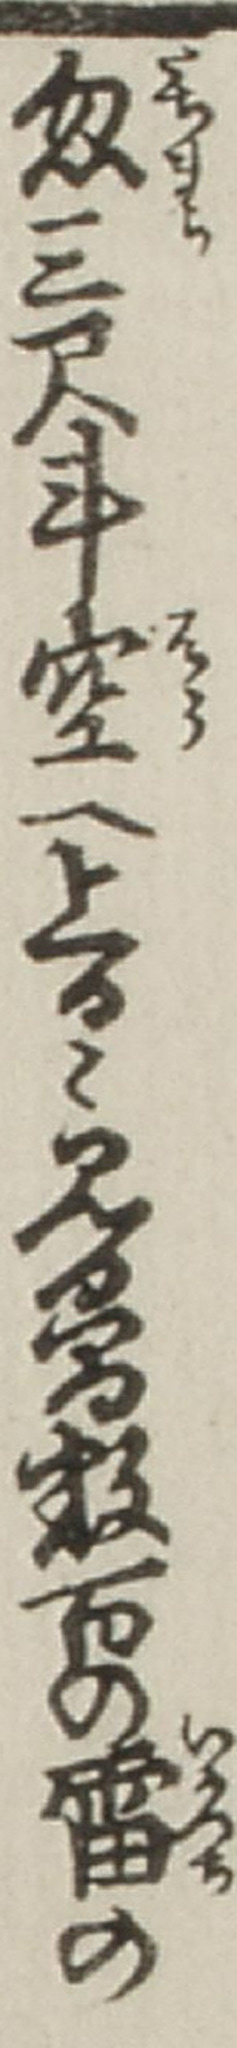忽三尺計空へ上ると見る間数百の雷の
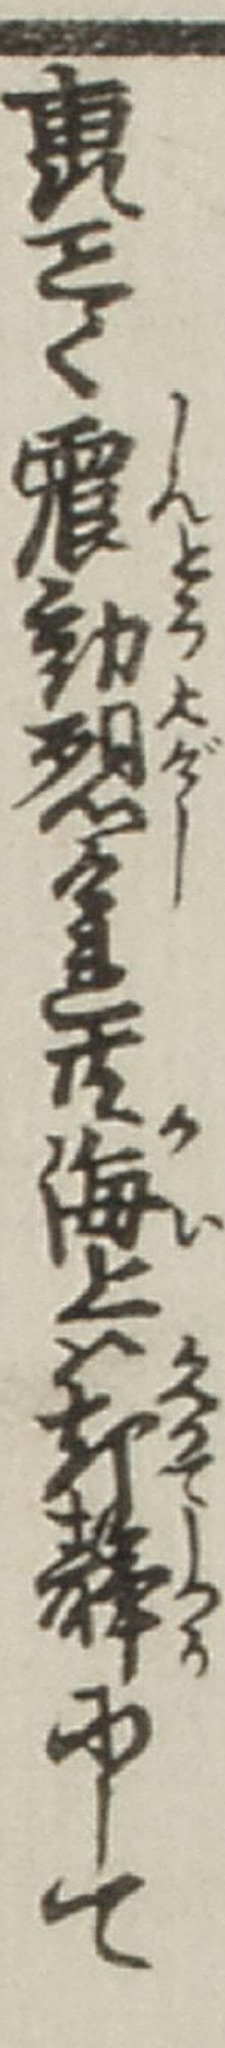轟ことく震動烈けれ共海上は却静にして
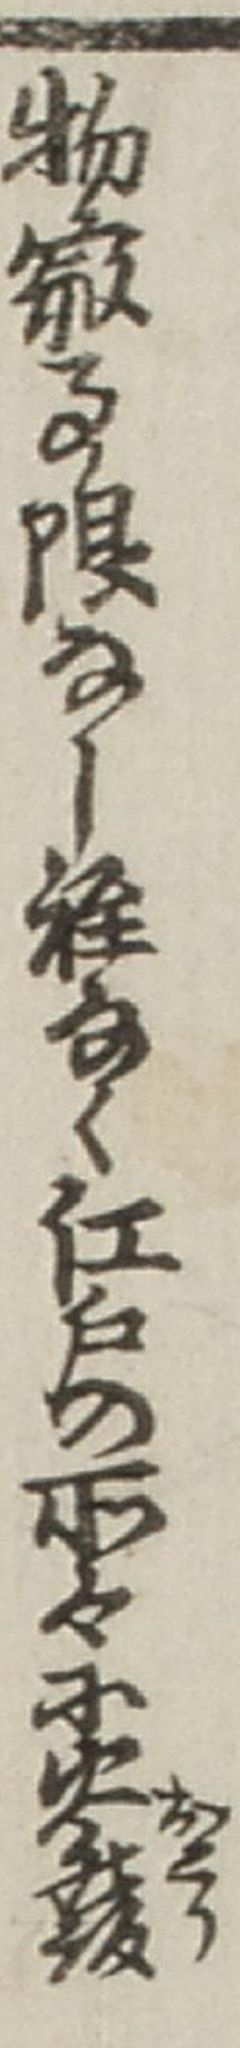物寂事限なし程なく江戸の所々に火発
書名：安政見聞誌　下
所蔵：東京大学地震研究所図書室 Earthquake Research Institute Library, The University of Tokyo, JAPAN
